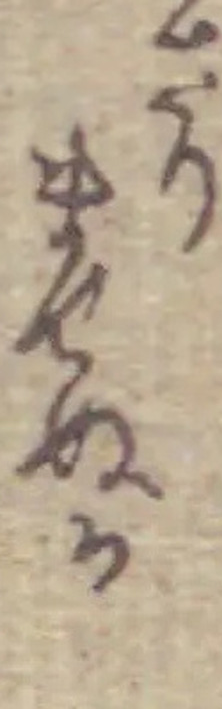ませぬか

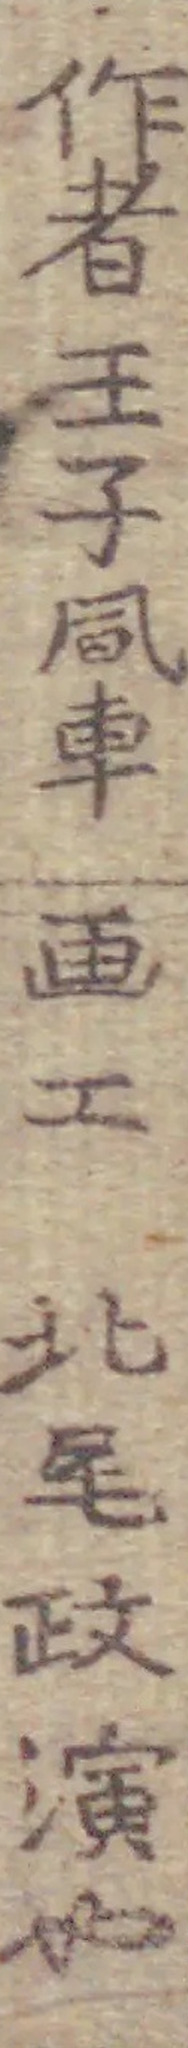作者王子風車画工北尾政演也？
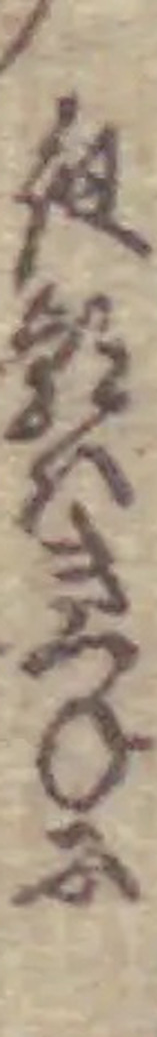夜朝はきつねに
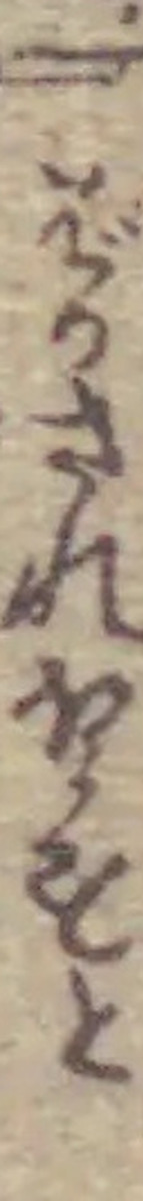ばかされほうすと
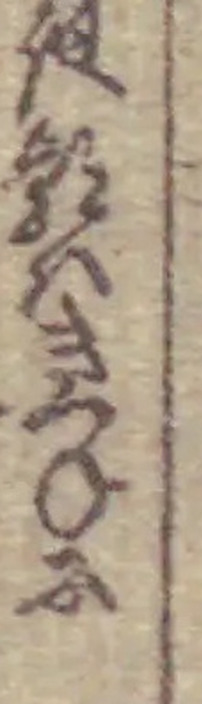夜朝はきつねに
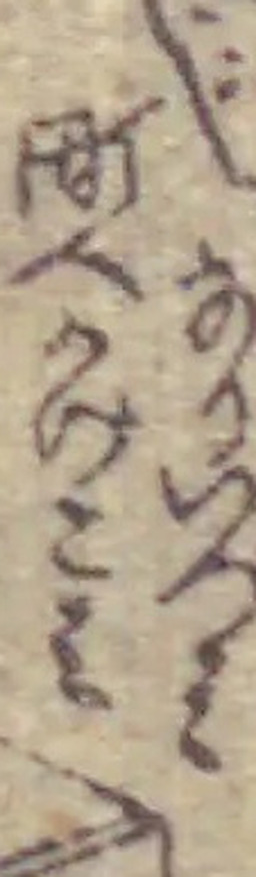町へかけこみ
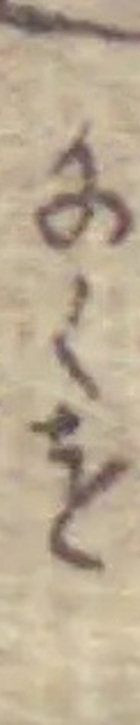にくを
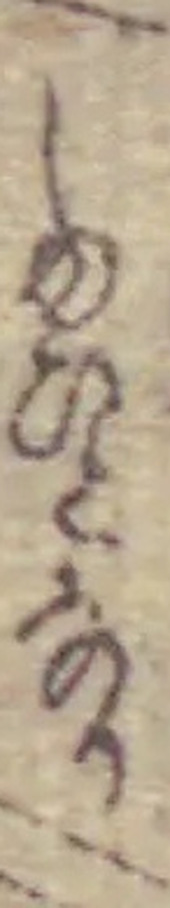しゆひとなり
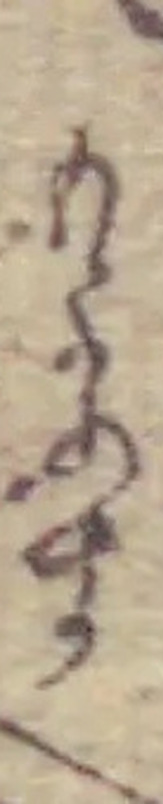もよふす
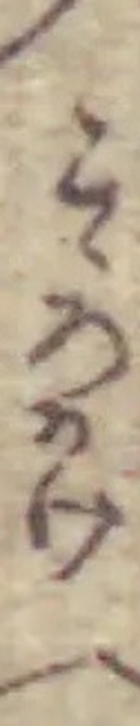こゝろかけ
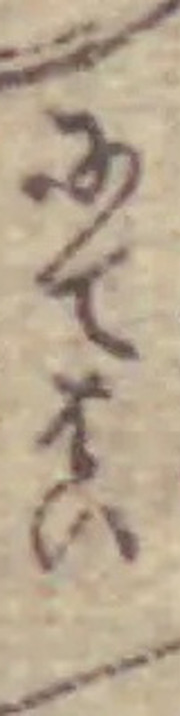にてはい
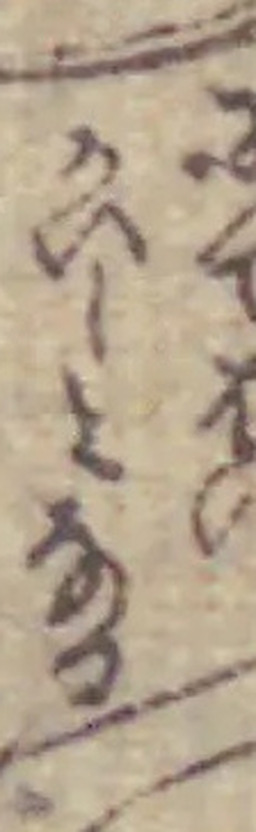かいしとなる
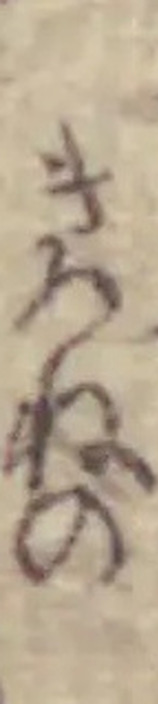きつねの
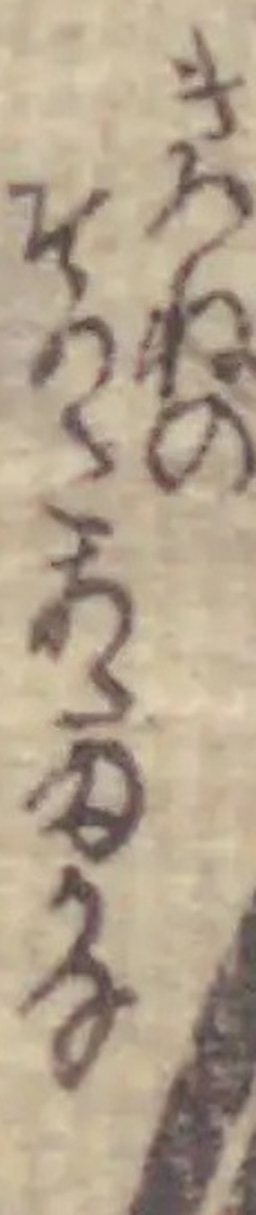そつたあたまかな
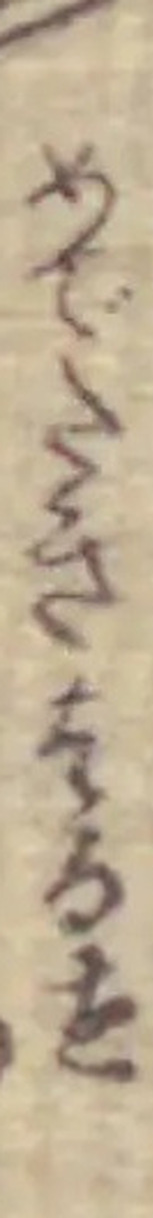めでたきはるを
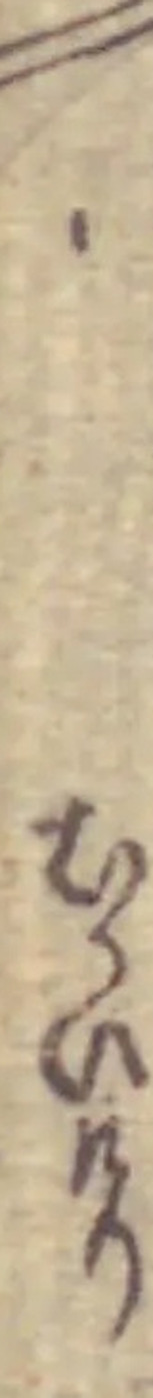むかいけり
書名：夜野中狐物 2巻
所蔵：国立国会図書館 National Diet Library, JAPAN
